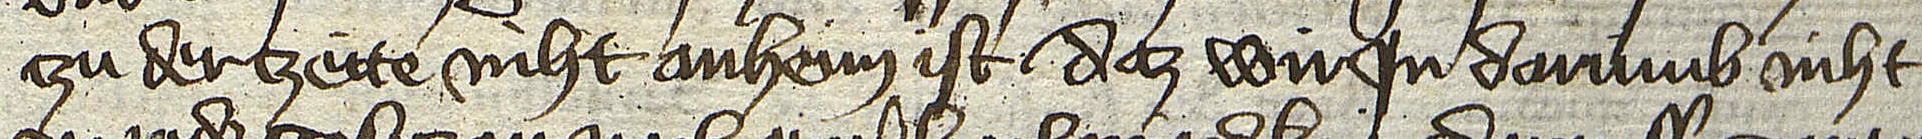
cʒu der cʒeite niht anheim iſt / daʒ wir In darümb niht
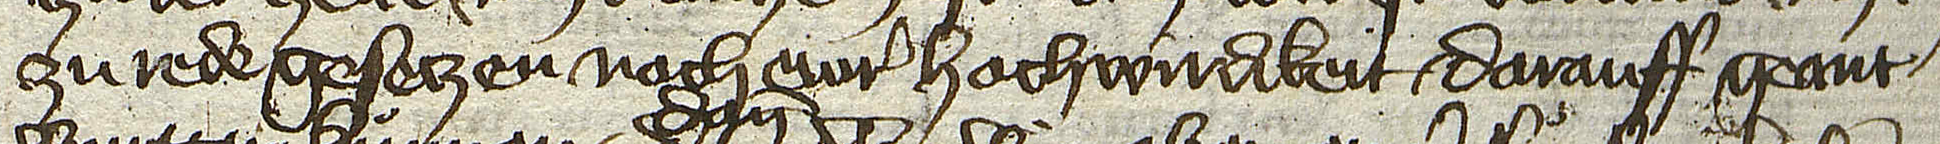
ʒu rede geſecʒen noch ewr* hochwirdikeit / darauff geant =
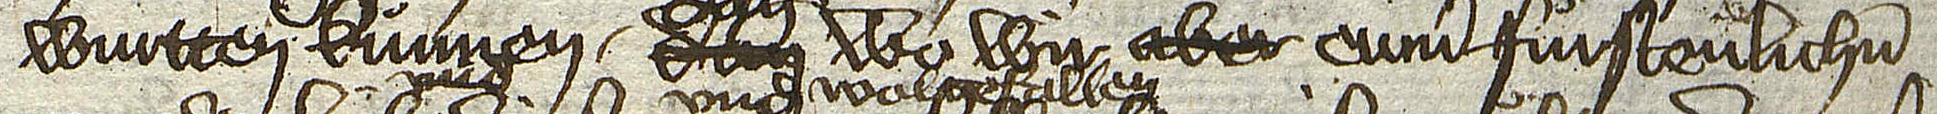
wurtten künnen / dan* wo wir aber ew*n fürſtenlich*n
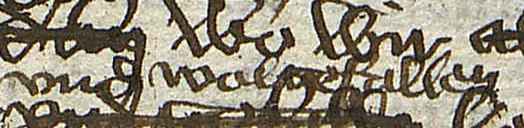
vnd wolgefallen
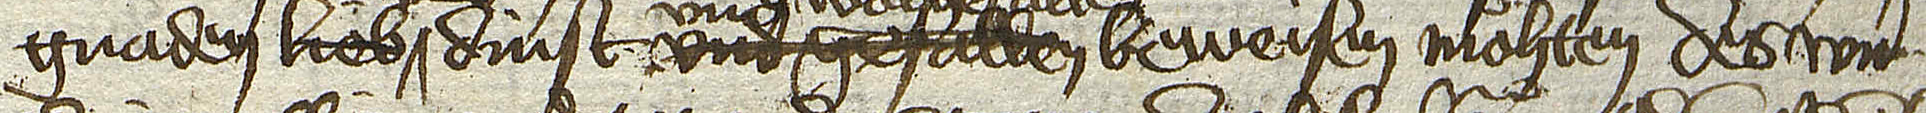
gnaden lieb dinſt vnd gefallen beweiſen möhten Des wn*
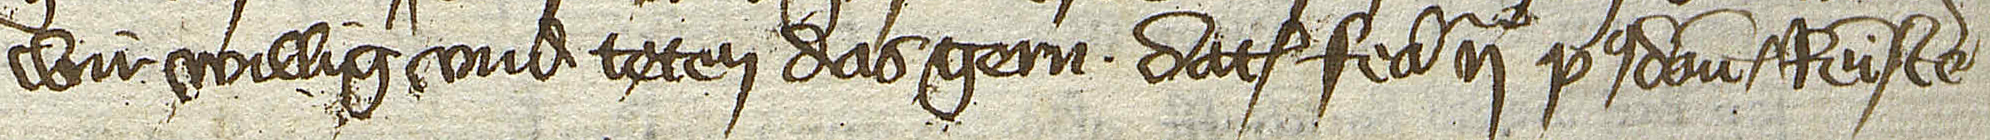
wir willig vnd teten das gern . Dat* fe*a ii* p* doi* Reiſce*
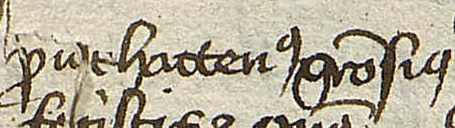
p*ut hacten* g*roſi*
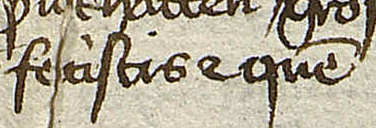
feciſtis @ que*
